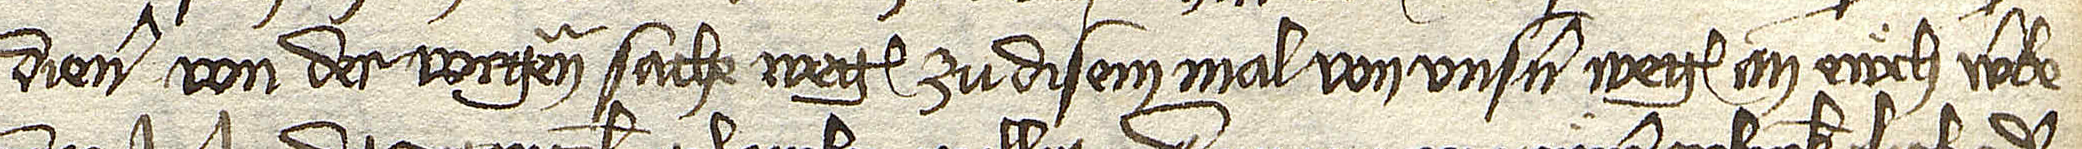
dien* von der vorgen* ſache weg* ʒu diſem mal von vnſn* weg* an eẅch w*be
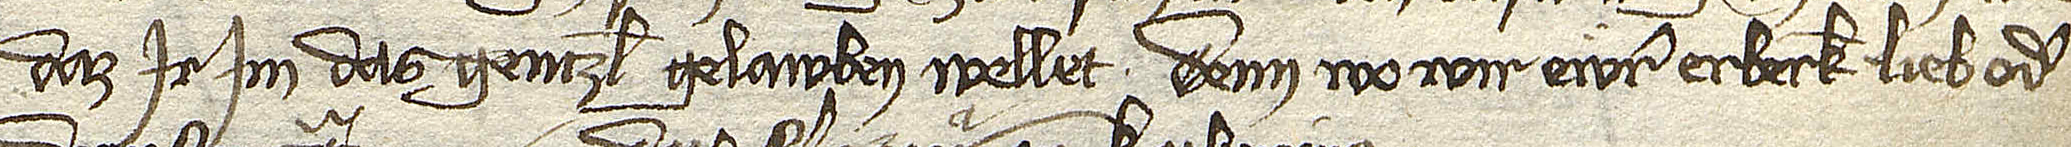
daʒ Ir Im das gencʒl* gelawben wellet . Denn wo wir eẅr* erberk* lieb od*
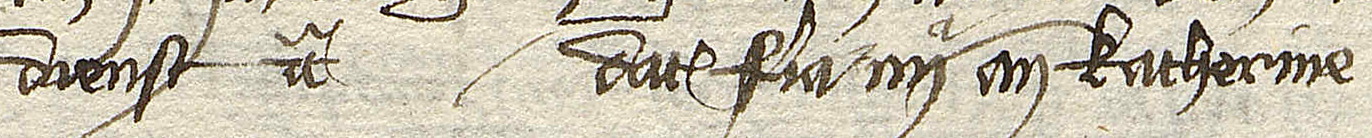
dienſt ec* / Dat* fi*a iiii* an* katherine
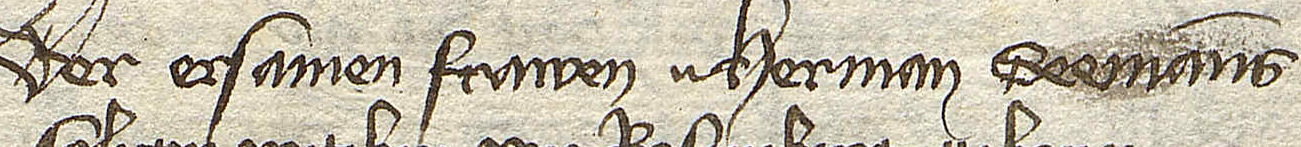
Der erſamen frawen ~ herman Seeman*s
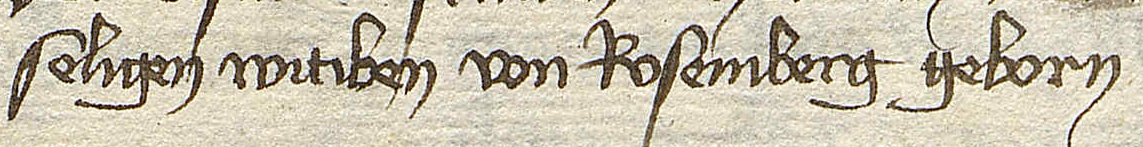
ſeligen witiben von Roſemberg geborn
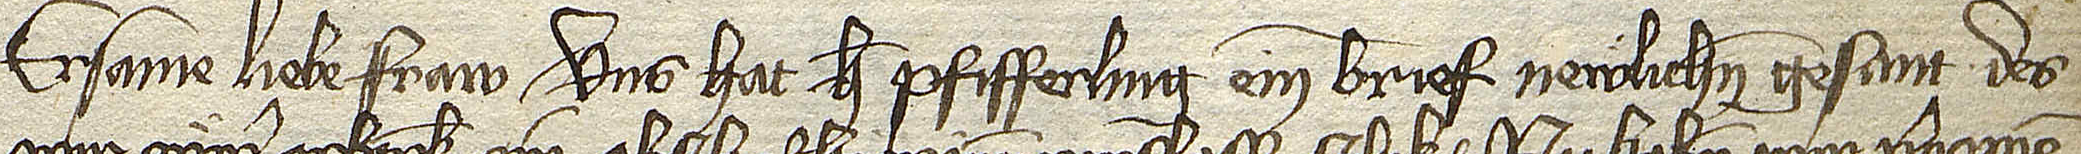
Erſame liebe fraw / Vns hat h* pfifferling ein* brief neẅlichn* geſant . des
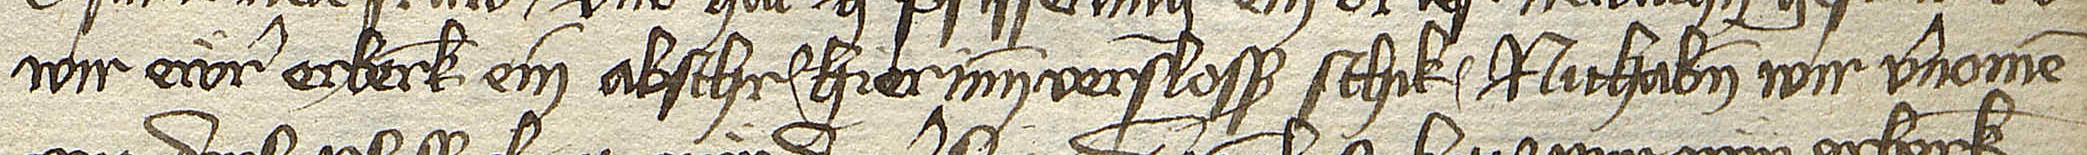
wir eẅr* erberk* ein abſchr* hierinn* verſloſſ* ſchik* Nu habn* wir v*nome*
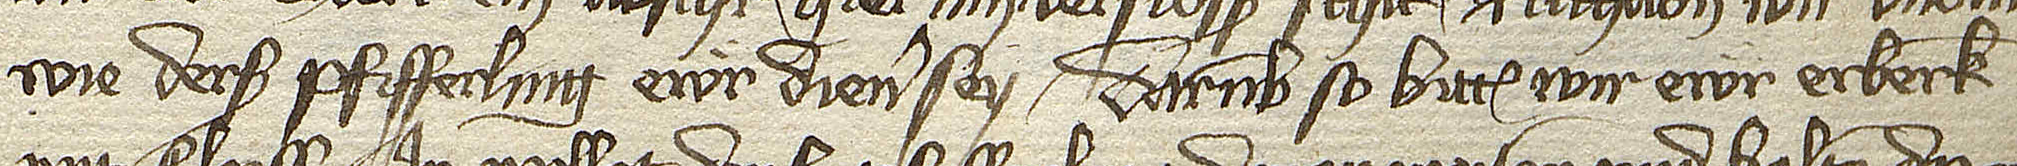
wie derſ* pfifferling eẅr dien* ſey / Darub* ſo bitt* wir eẅr erberk*
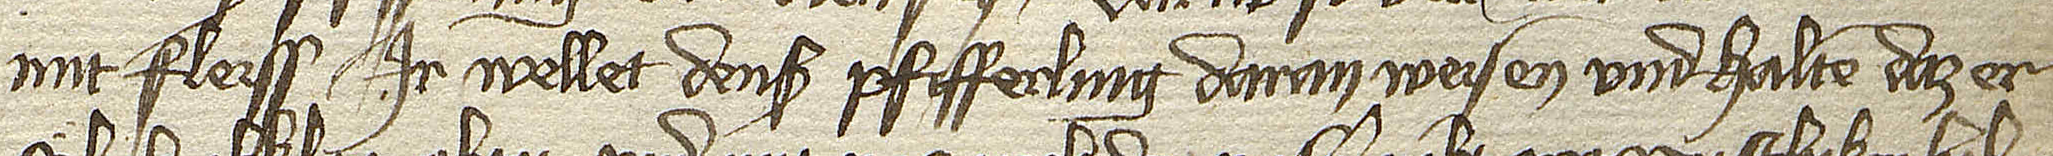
mit fleiſſ / Ir wellet denſ* pfifferling daran weiſen vnd halte* daʒ er
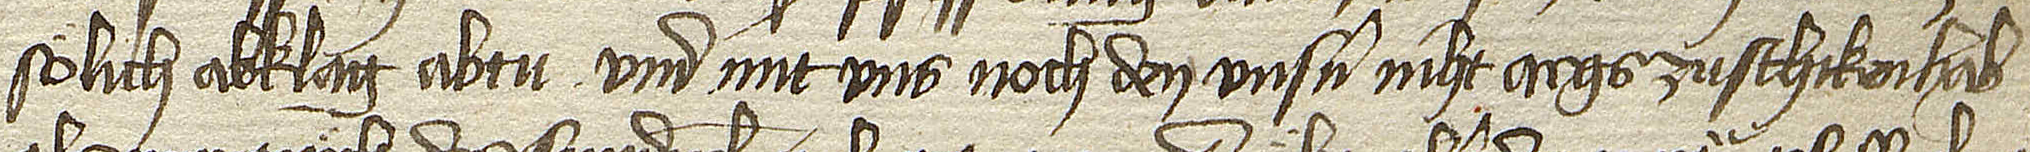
ſölich abklag abtu . vnd mit vns noch den vnſn* niht args ʒu ſchiken hab
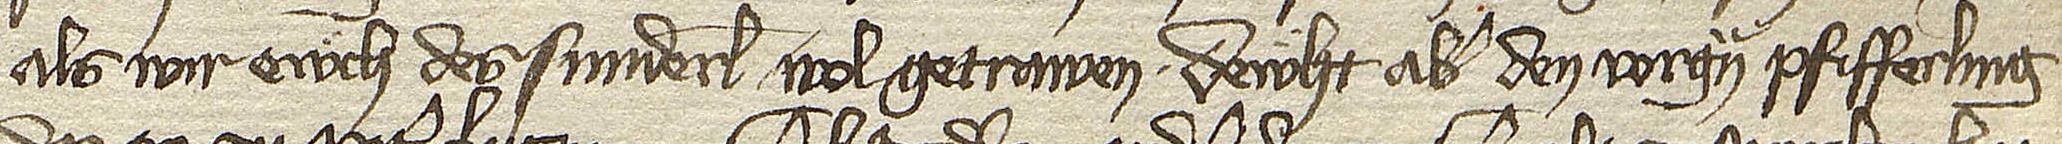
als wir eẅch des ſunderl* / wol getrawen / Deẅht ab* den vorgn* pfifferling
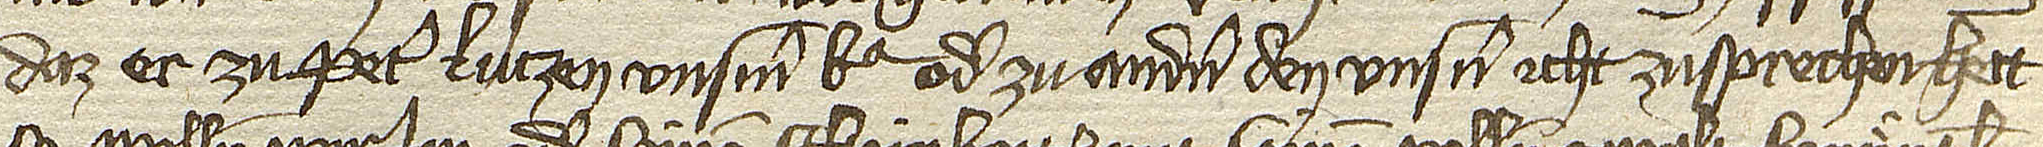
daʒ er ʒu Pet* lucʒen vnſm* b* od* ʒu andn* den vnſn* icht ʒu ſprechen hett
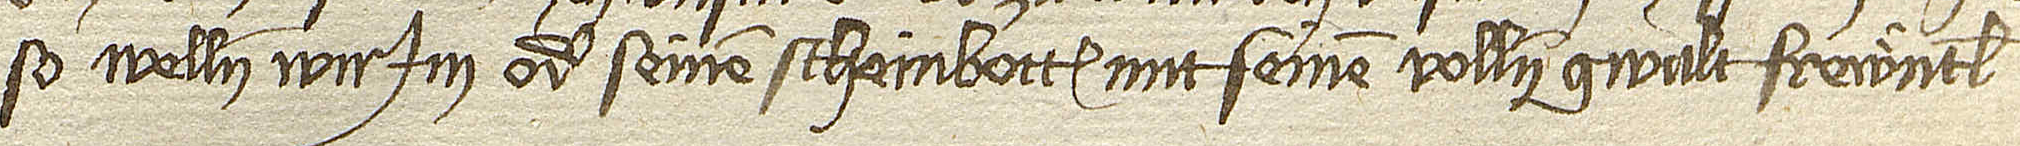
ſo welln* wir Im od* ſeine* ſcheinbott* mit ſeine* volln* gwalt freẅntl*
